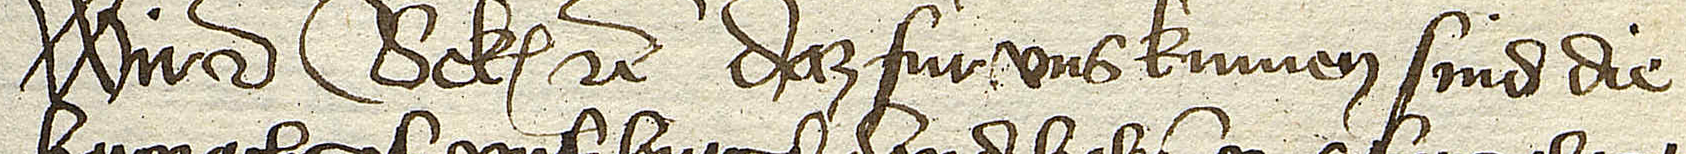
Wir ec* Bek* ec* daʒ für vns kumen ſind die
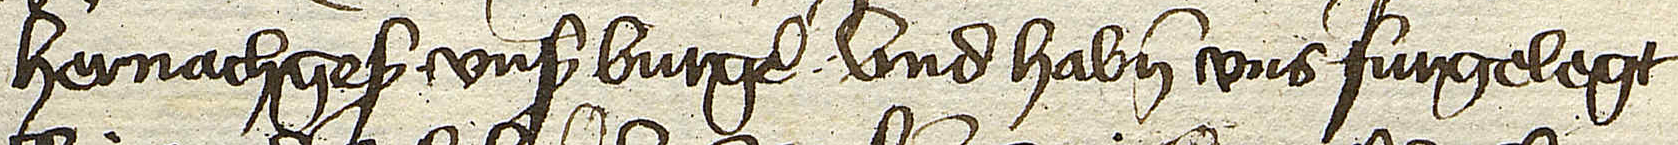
hernachgeſ* vnſ* burge* vnd habn* vns furgelegt
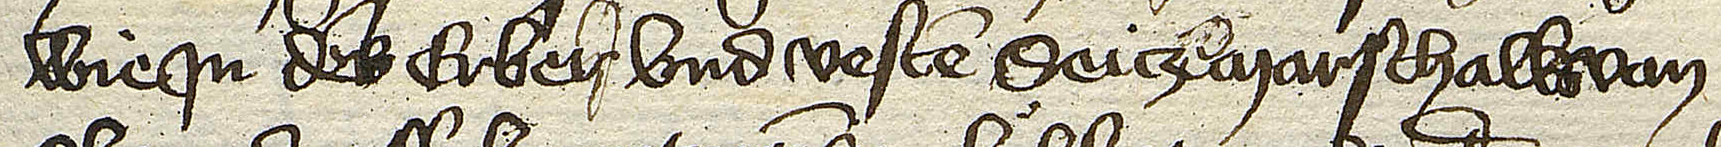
wie In des Erber* vnd veſte* Seicʒe* Marſchalk von
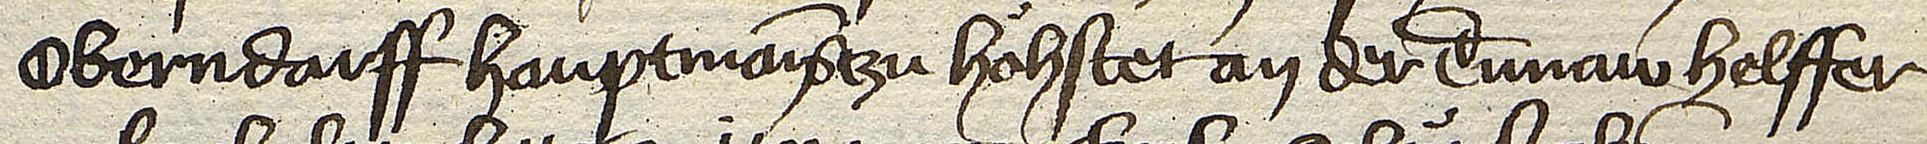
Oberndorff hauptman*s cʒu höhſtet an der Tunaw helffer
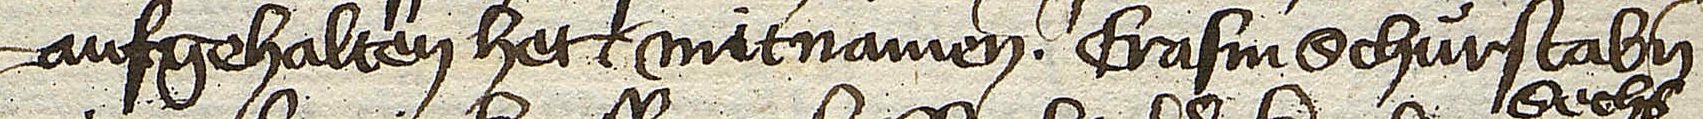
aufgehalten het / mitnamen . Eraſm Schürſtabn*
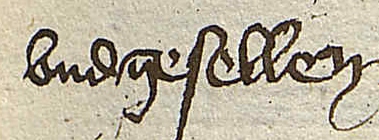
vnd geſellen
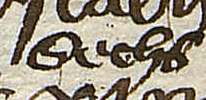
Sechs
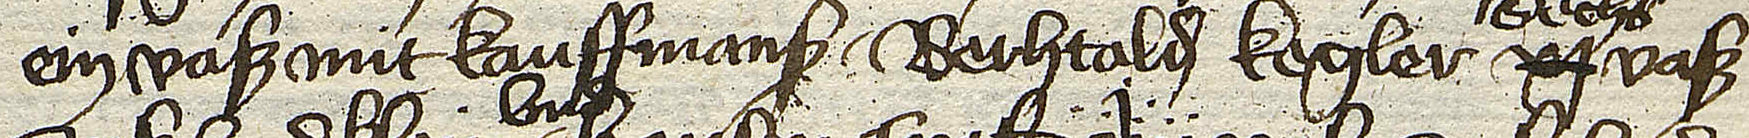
ein vaſʒ mit kauffmanſ* / Berhtold* kegler xi vaſʒ
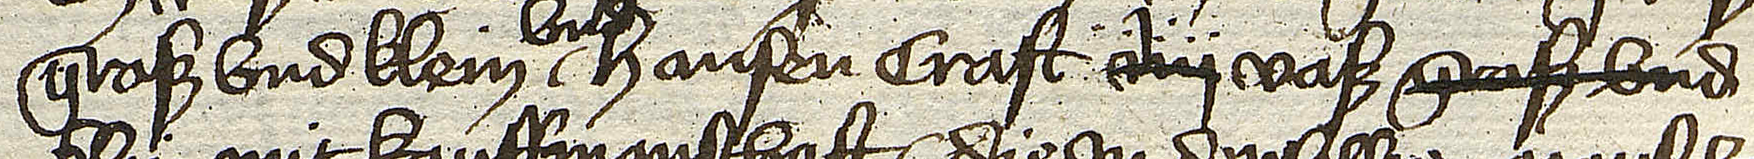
groſʒ vnd klein / hanſen Craft iiii vaſʒ groſʒ vnd
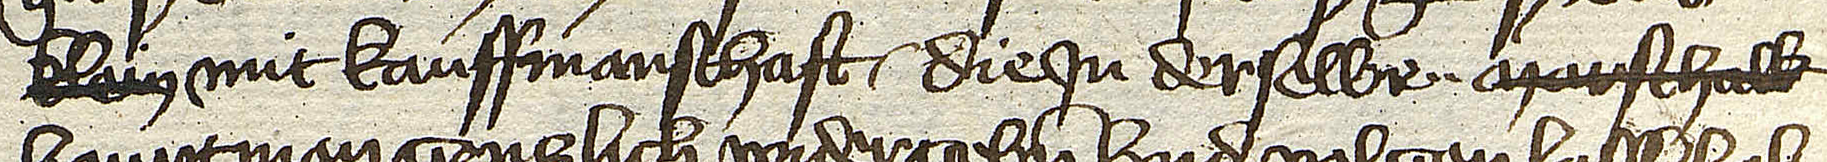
klein mit kauffmanſchaft / die In derſelbe ~ Marſchalk
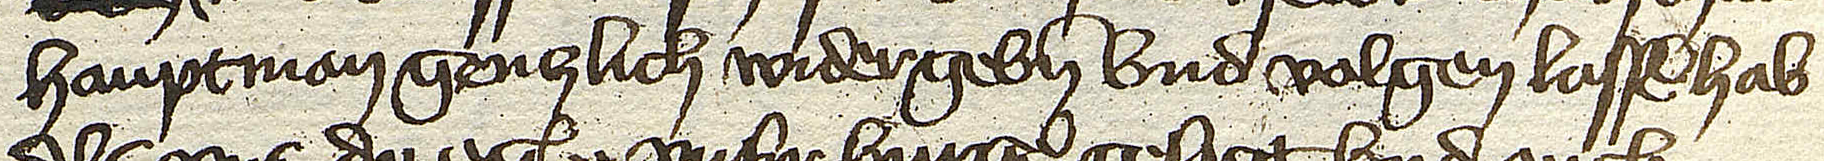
hauptman gencʒlich widergebn* vnd volgen laſſe* hab
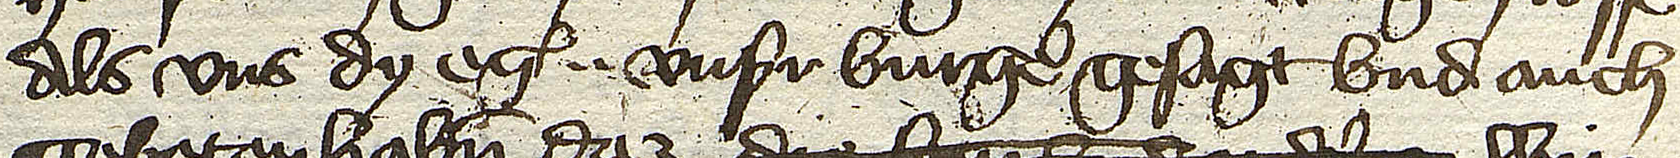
Als vns dy eg* ~ vnſ*r burge* geſagt vnd auch
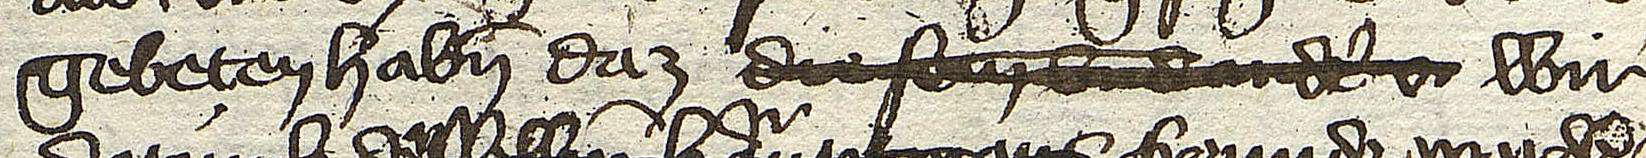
gebeten habn* daʒ die ſein vnd ande* wir
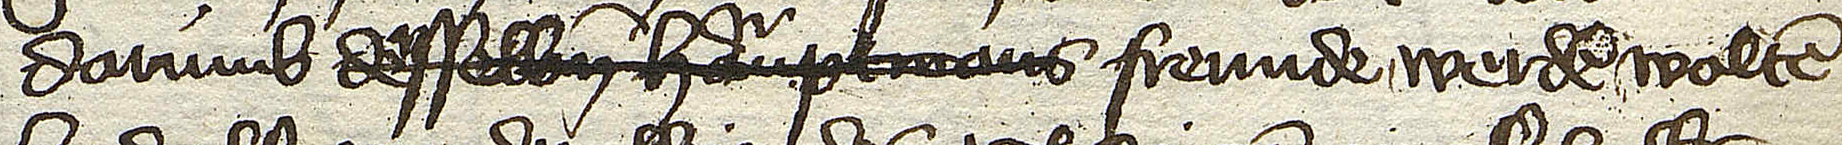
darümb deſſelbn* hauptmans freunde werde* wolte*
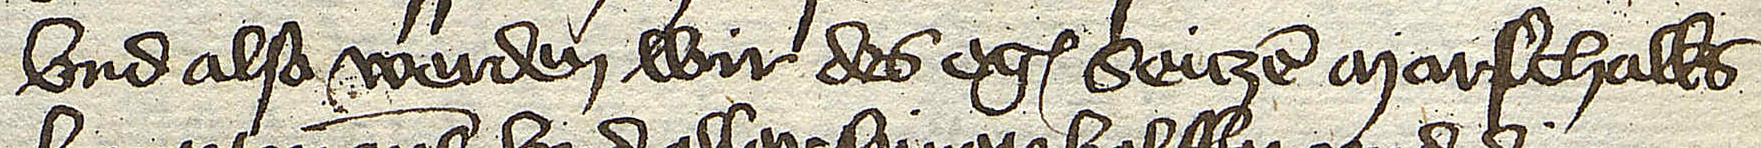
vnd alſo werden wir des eg* Seicʒe* Marſchalks
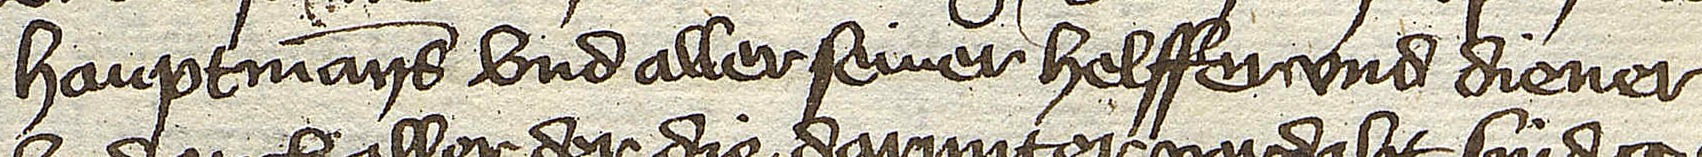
hauptmans* vnd aller ſeiner helffer vnd diener
